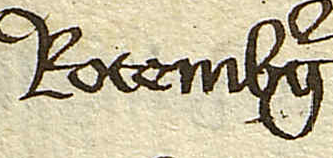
Rotemb*g
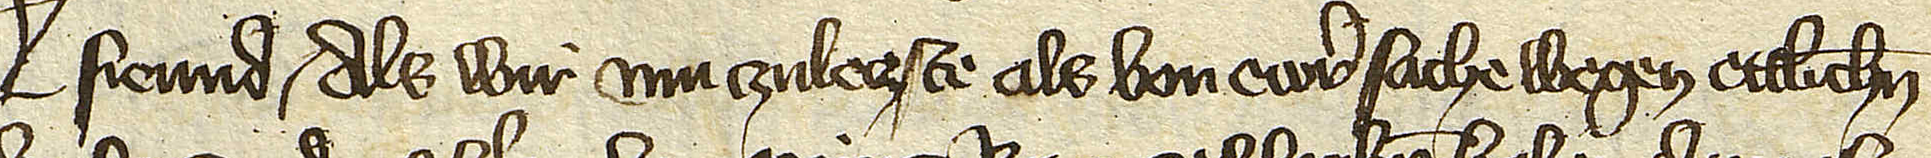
L* freund / Als wir nu cʒulecʒſte als von ewr* ſache wegen ettlichn*
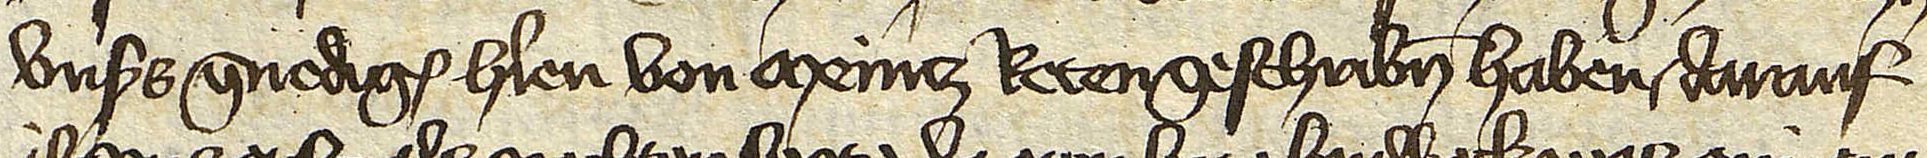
vnſ*s gnedig* h*ren von Meincʒ Reten geſchribn* haben / darauf
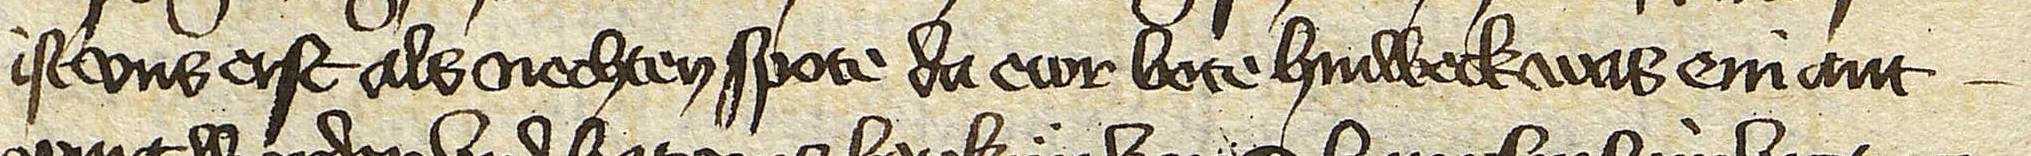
iſt vns erſt nechten ſpote da ewr bote hinweck was ein ant -
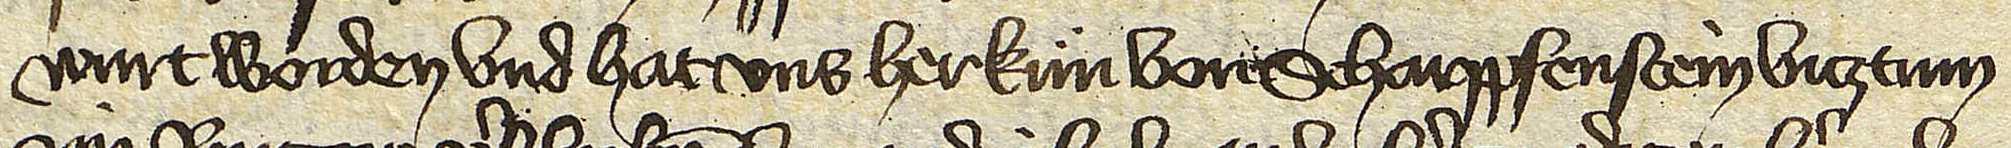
wurt worden vnd hat vns her kün von Scharppfennſtein vicʒtum
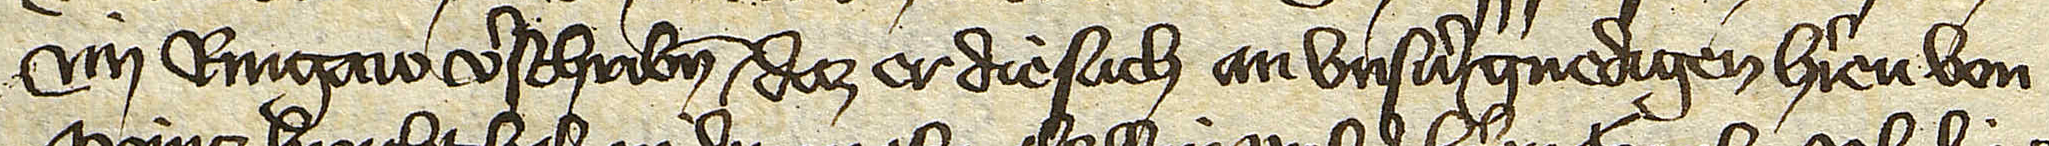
in Ringaw v*ſchribn* / daʒ er die ſach an vnſn* gnedigen h*ren von
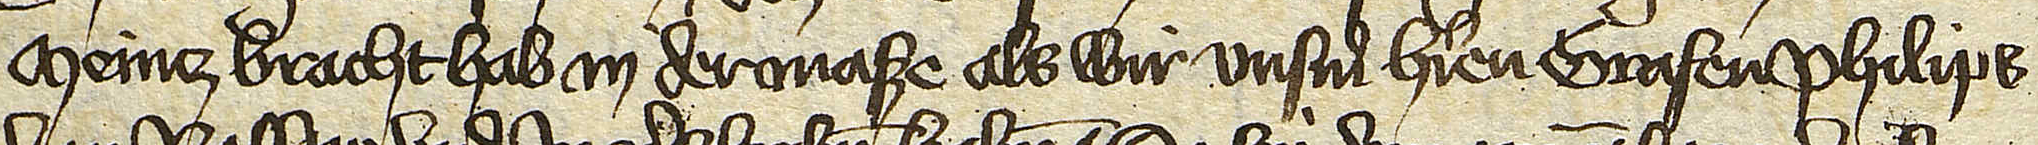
Meincʒ bracht hab in der maſʒe als wir vnſm* hr*en Grafen Philips
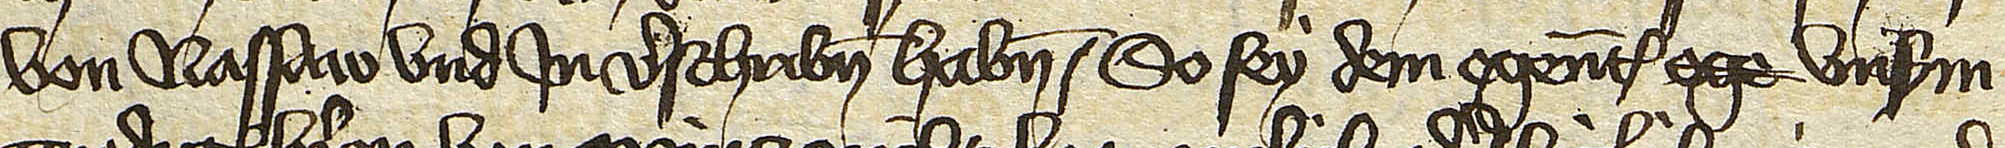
von Naſſaw vnd In v*ſchribn* habn* / So ſey dem egent* ege vnſ*m
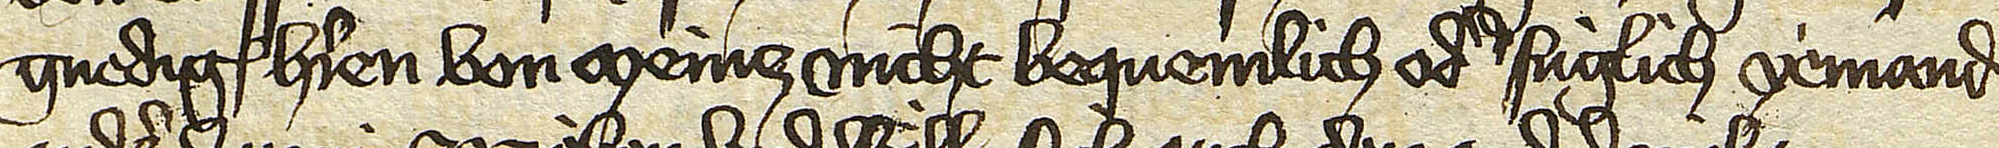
gnedig* hr*en von Meincʒ nicht bequemlich od* füglich yemand
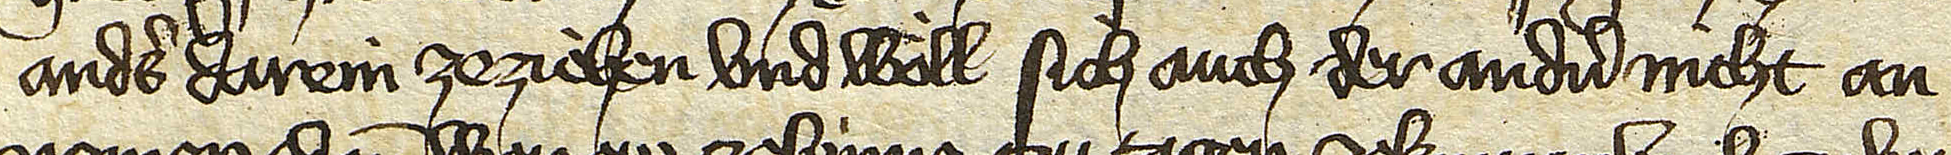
ands* darein cʒeʒiehen vnd wöll ſich auch der andn* nicht an
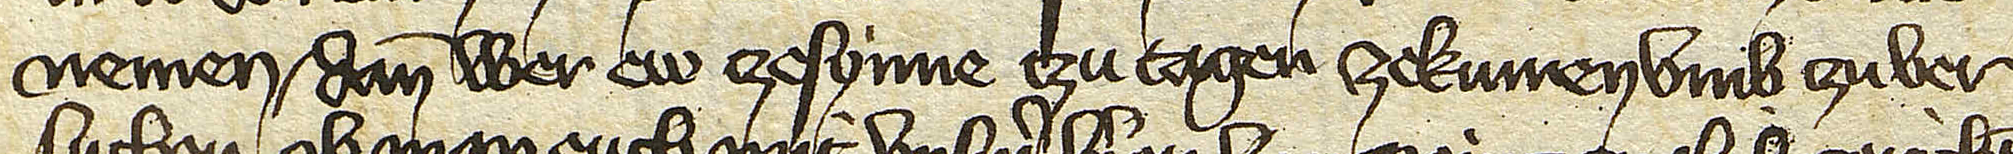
nemen / dan* wer ew cʒeſynne cʒu tagen cʒekumen vmb cʒu ver
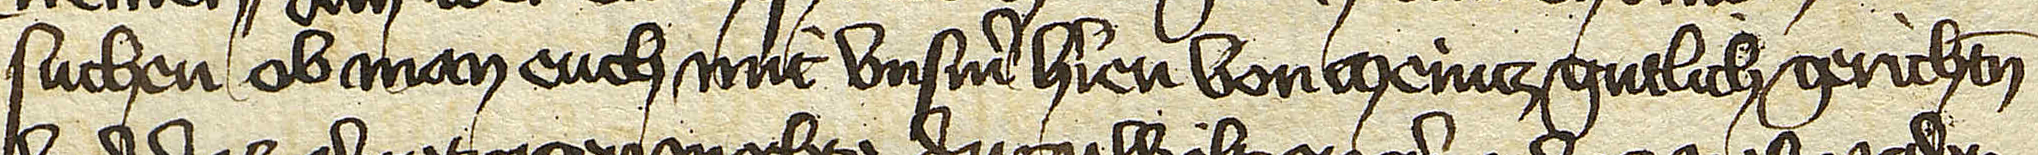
ſuchen ob man euch mit vnſm* h*ren von Meincʒ gutlich gerichtn*
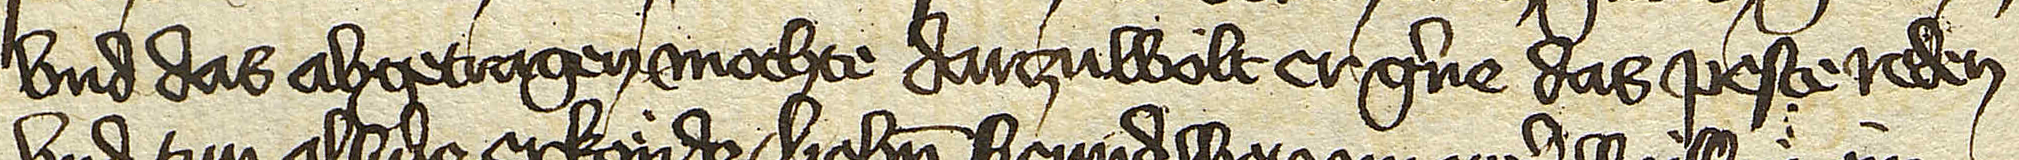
vnd das abgetragen mochte darcʒu wölt er g*ne das peſte reden
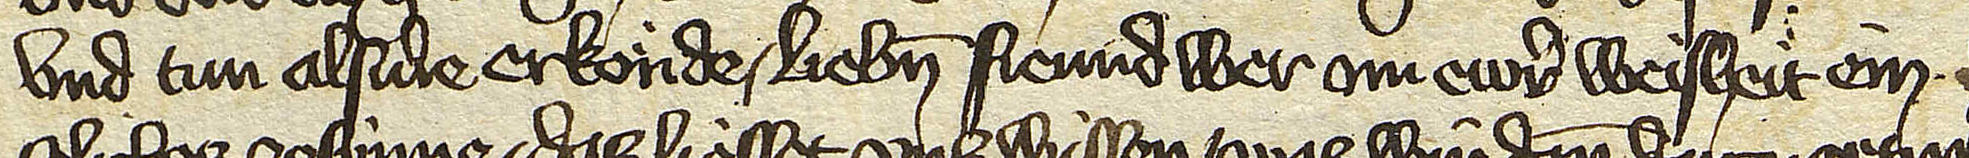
vnd tun alſu*re er könde / liebn* freund wer nu ewr* weiſheit ein
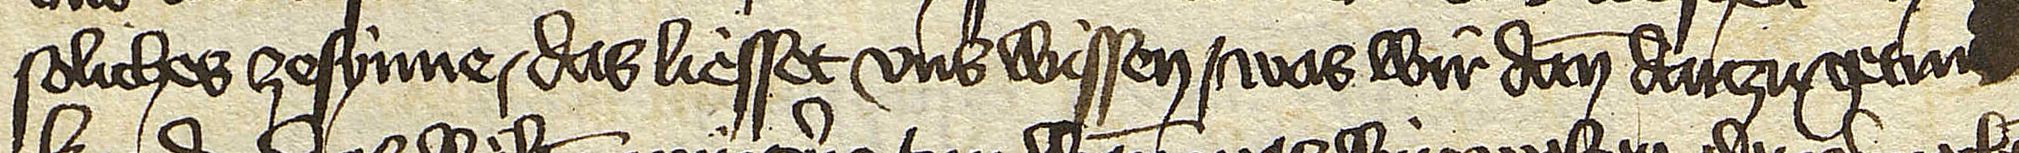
ſoliches cʒeſynne / das lieſſet vns wiſſen / was wir dan* darcʒu getun
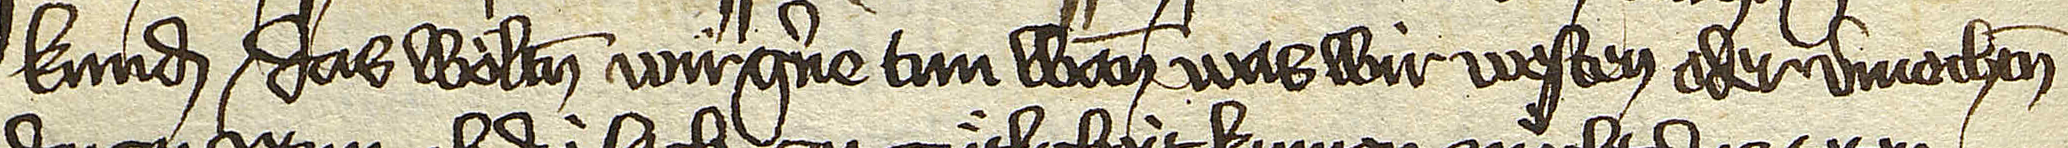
kund* / das wöltn* wir g*ne tun wan* was wir weſten oder v*mochtn*
